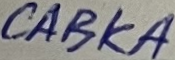савка
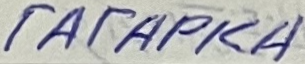гагарка
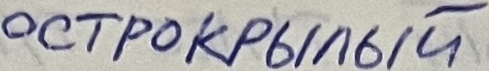острокрылый
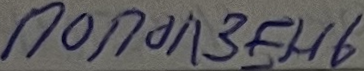поползень
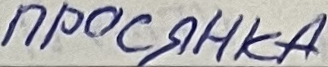просянка
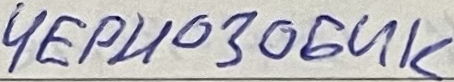чернозобик
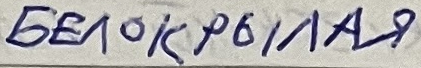белокрылая
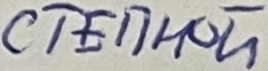степной
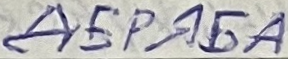деряба
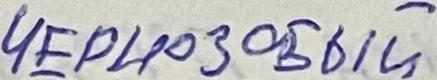чернозобый
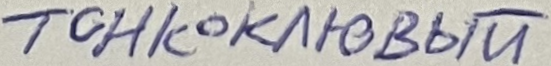тонкоклювый
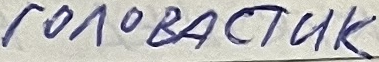головастик
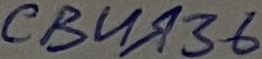свиязь
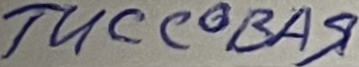тиссовая
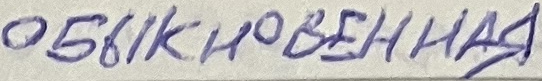обыкновенная
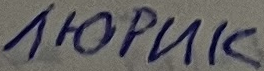люрик
